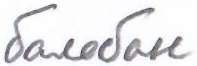балобан
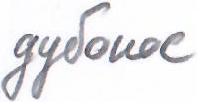дубонос
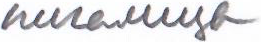пигалица
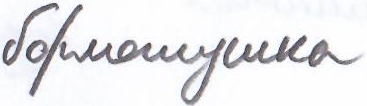бормотушка
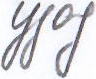удод
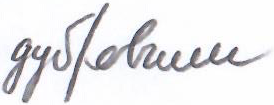дубровник
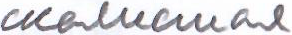скалистая
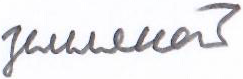земляной
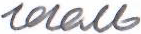гоголь
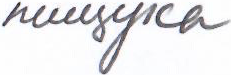пищуха
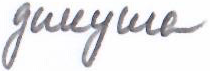дикуша
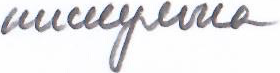пискулька
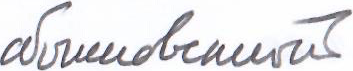обыкновенный
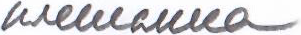плешанка
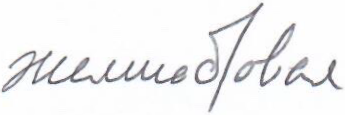желтобровая
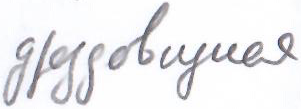дроздовидная
